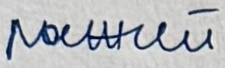рыжий
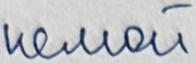немой
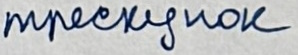трескунок
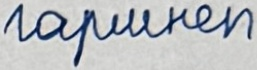гаршнеп
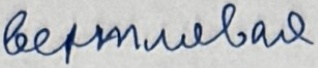вертлявая
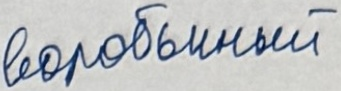воробьиный
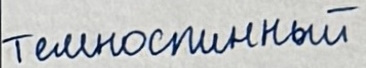темноспинный
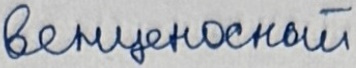венценосный
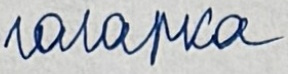гагарка
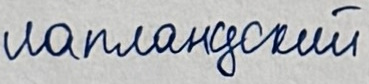лапландский
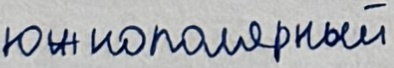южнополярный
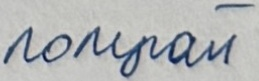попугай
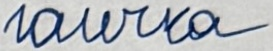гаичка
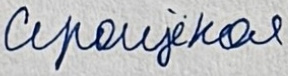серощёкая
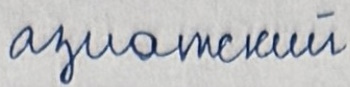азиатский
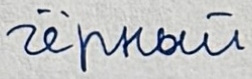чёрный
